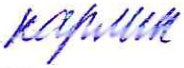карлик
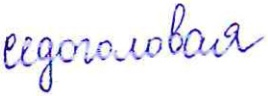седоголовая
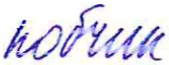кобчик
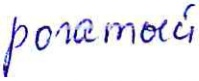рогатый
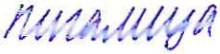пигалица
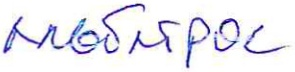альбатрос
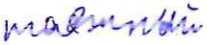таежный
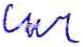сыч
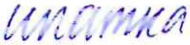ипатка
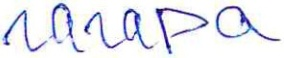гагара
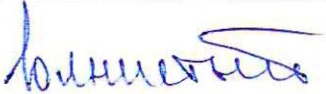волнистый
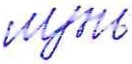лунь
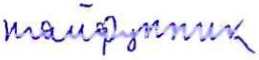тайфунник
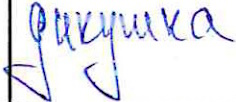дикушка
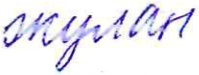жулан
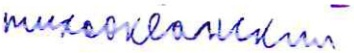тихоокеанский
